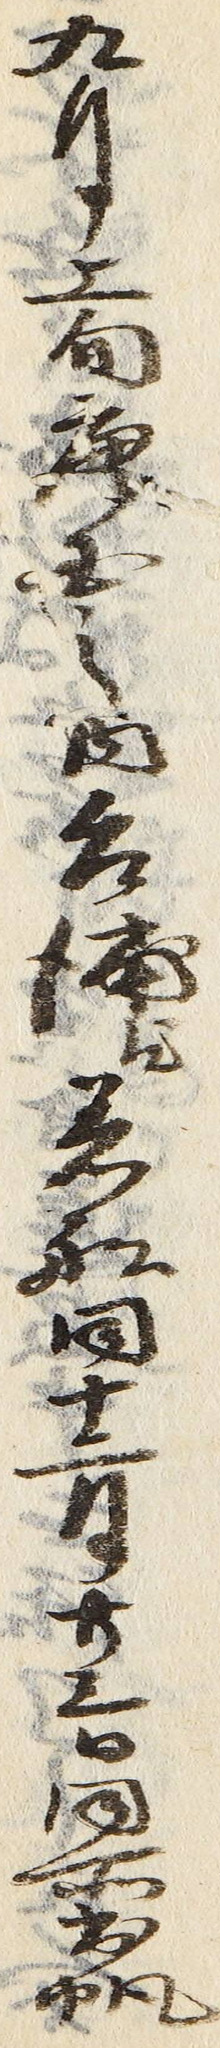九月上旬唐国之内乍浦江着舩同十二月廿三日同所出帆
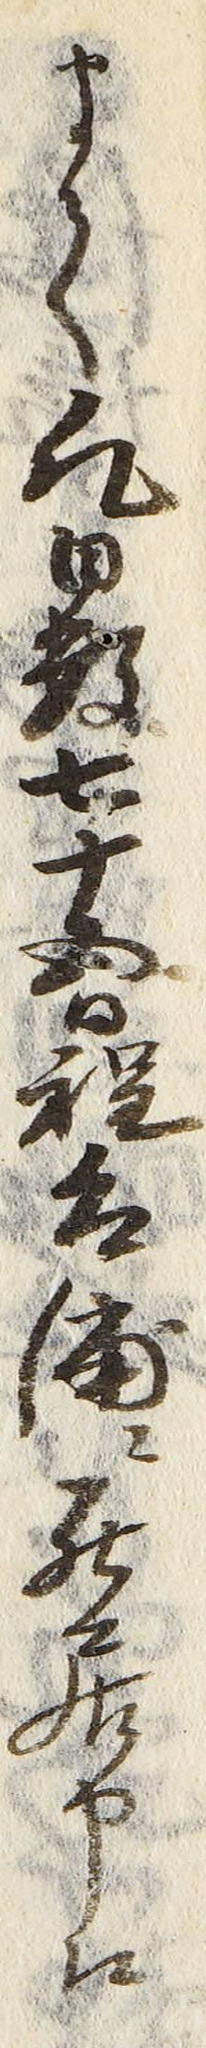申候て凡日数七十五日程乍浦ニ罷居申候
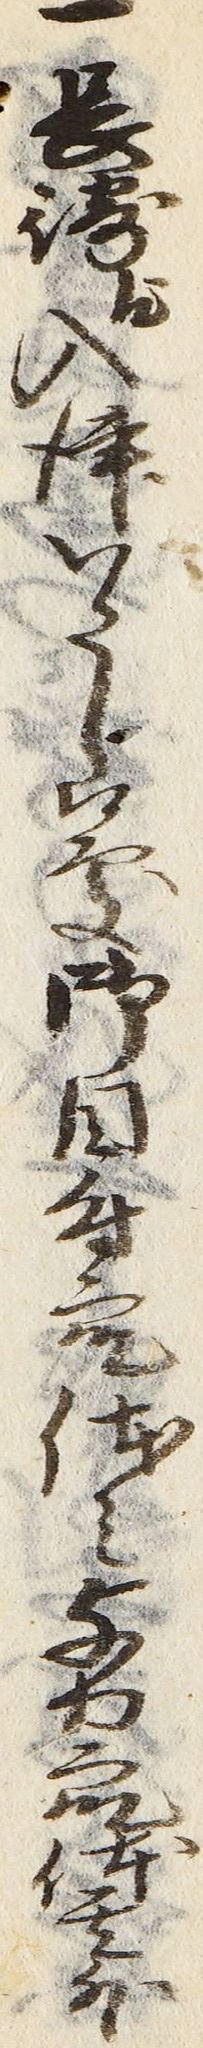一長崎江入津いたし候處御目付衆体之与力衆体其外
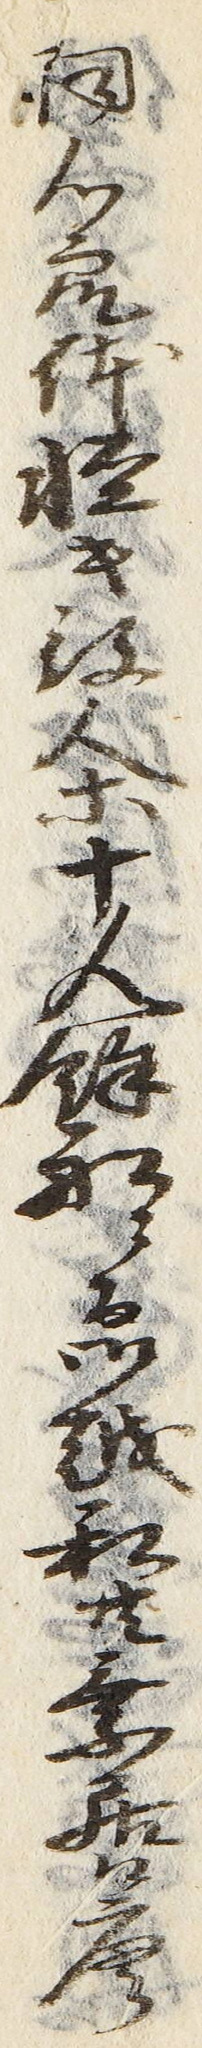同心衆体輕キ役人等十人餘舩ニ而御越私共乗居候唐
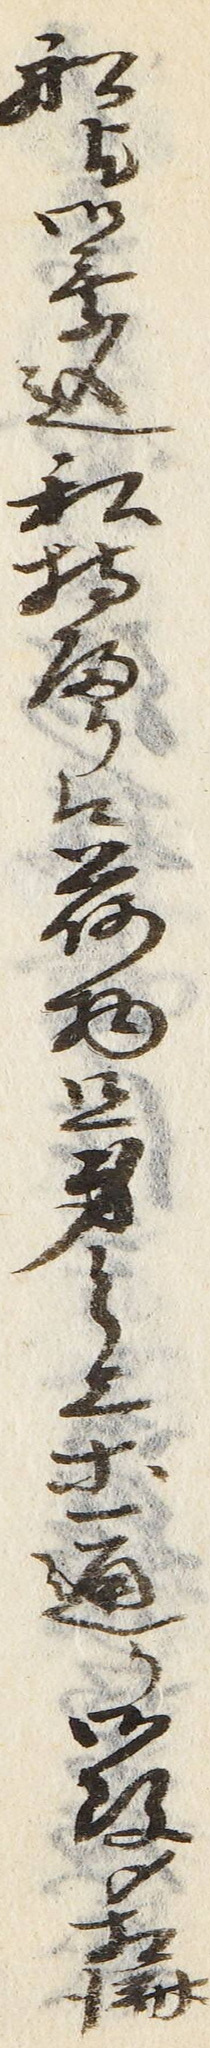舩江御乗込私持帰り候荷物但身之上等一通り御改メ相濟
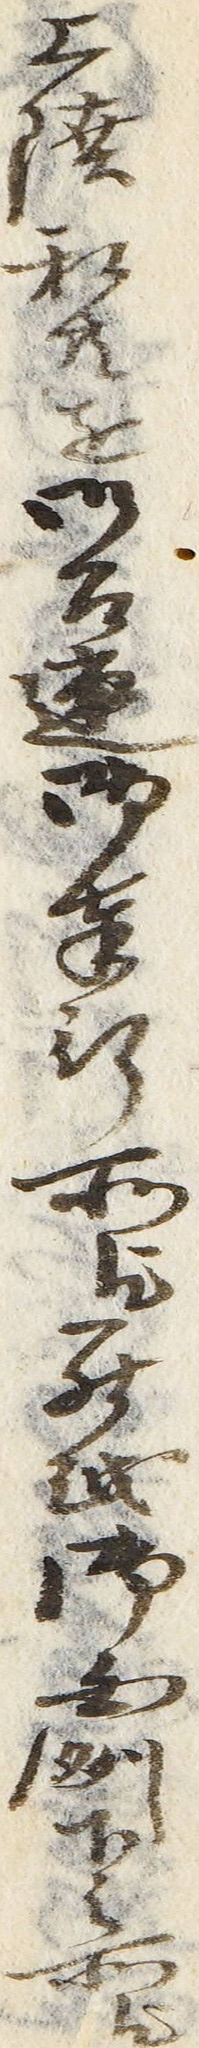上陸私共を御召連御奉行所江罷越御白洲下之所江
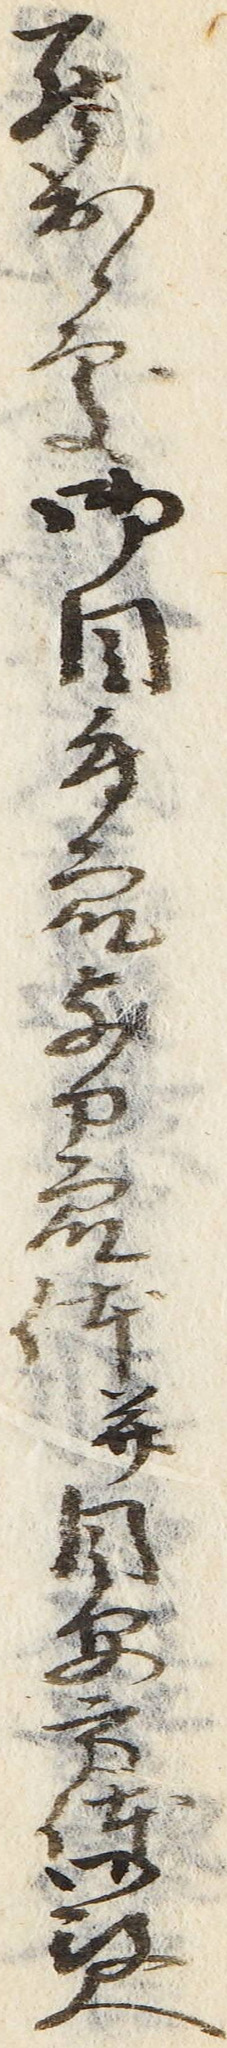罷出候處御目付衆与力衆体幷目安方体御役人
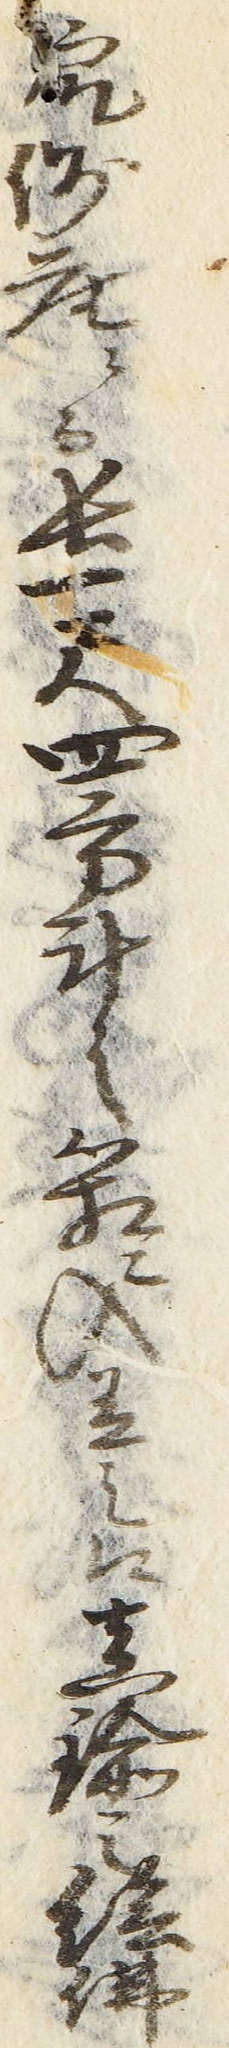衆例座ニ而長一尺四方斗之箱ニ入有之候真鍮之絵佛
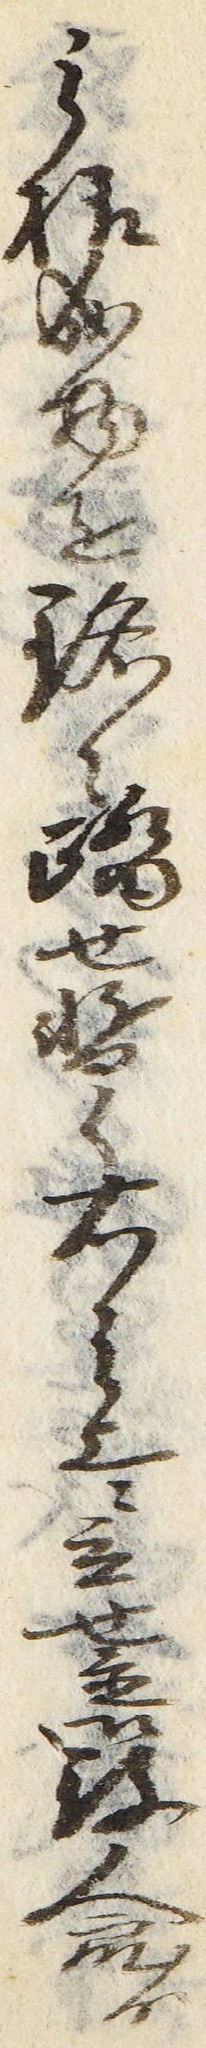之様成者を銘々踏せ暫く右之上ニ而立置御役人衆ゟ
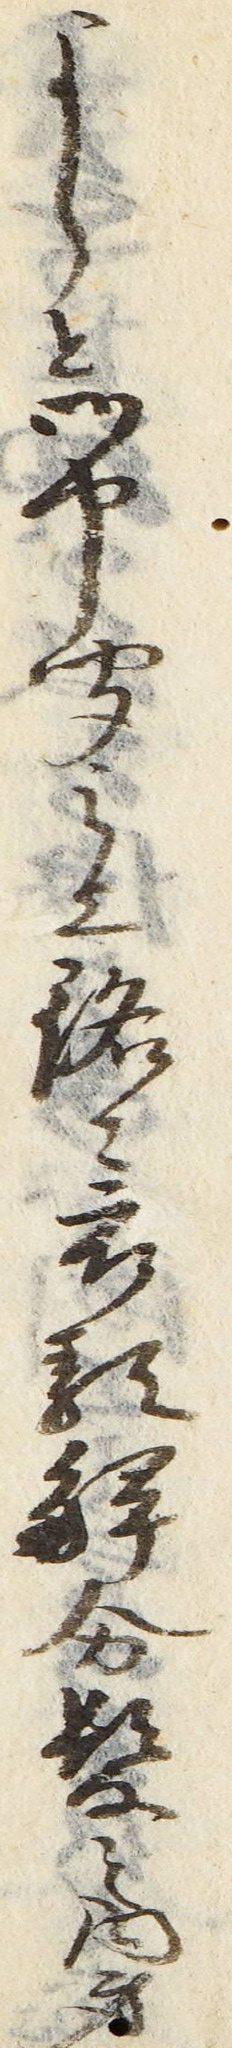よしと御申聞之上銘々衣類解分髪之内身

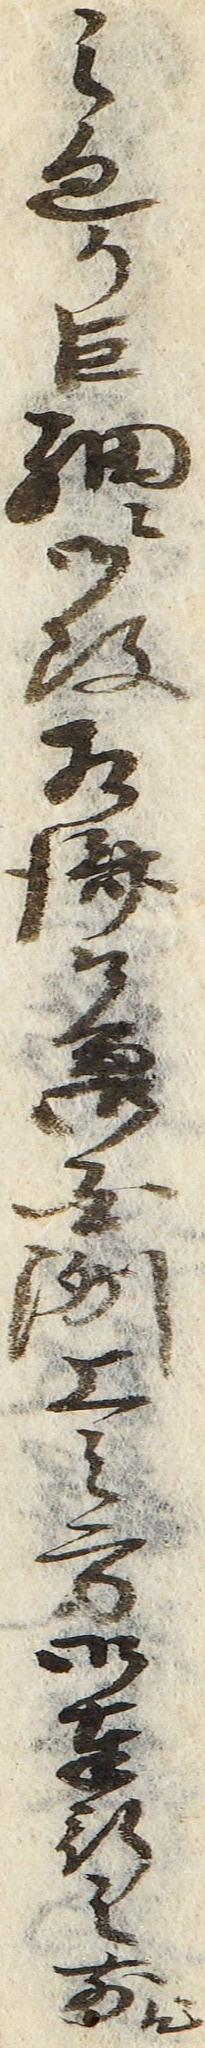之辺り巨細ニ相改相濟候而御白洲上之方御奉行之前江
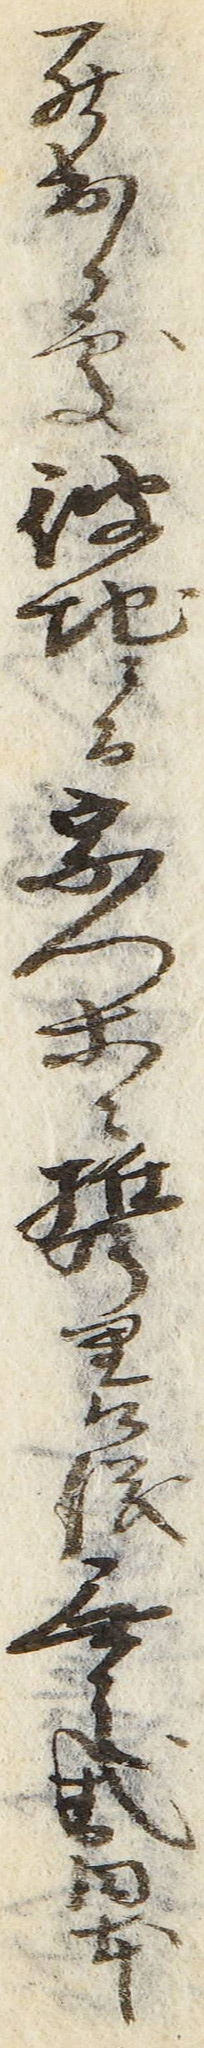罷出候處彼地ニ而宗門等ニ携り候儀無之哉日本
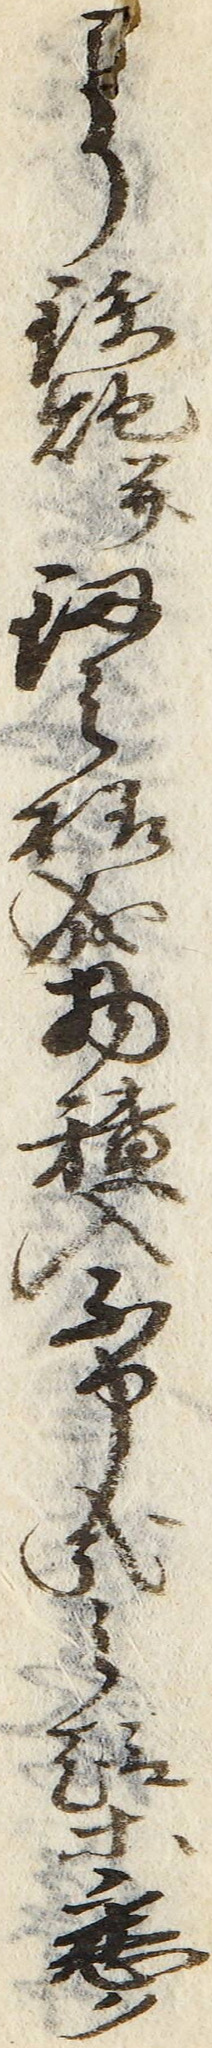より鉄砲幷剱之様成物積入不申哉之趣等悉ク
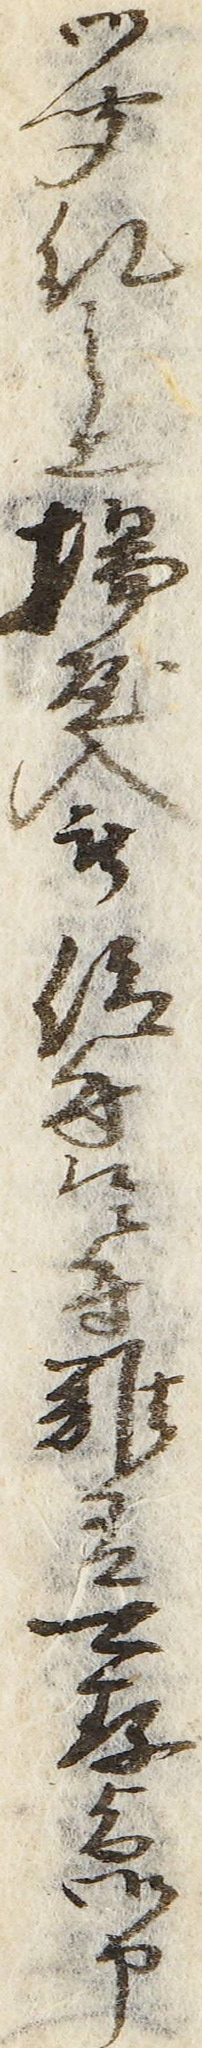御聞糺之上揚屋入被仰付候ニ付難有可存旨御申
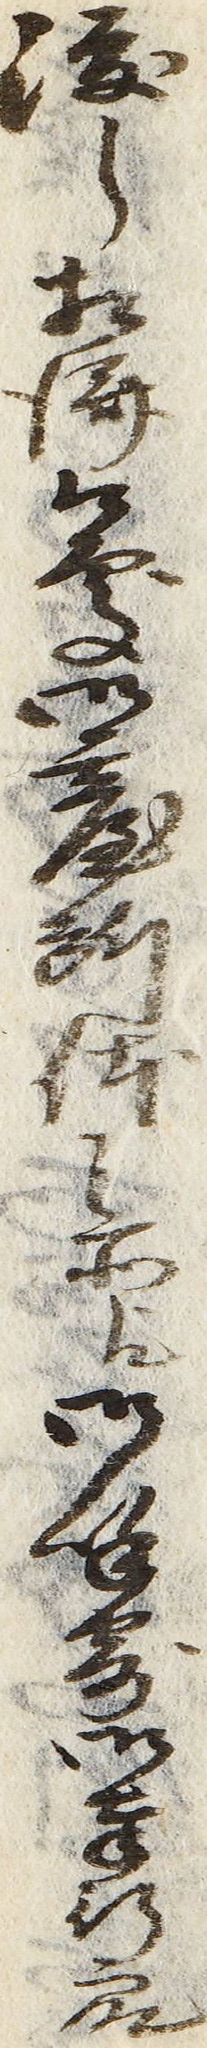渡し相濟候處御臺所体之所江御呼寄御奉行衆
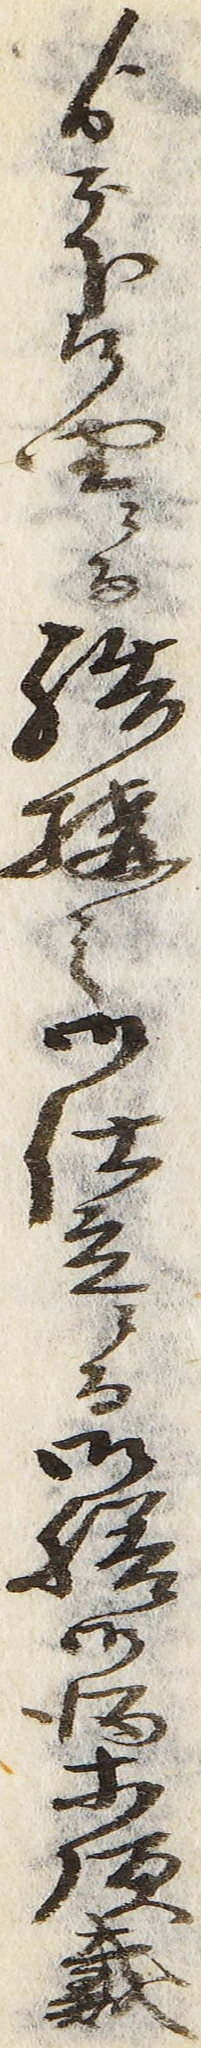ゟ被下候由ニ而結構之御仕立ニ而御膳御酒等頂戴
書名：漂流人善助聞書
